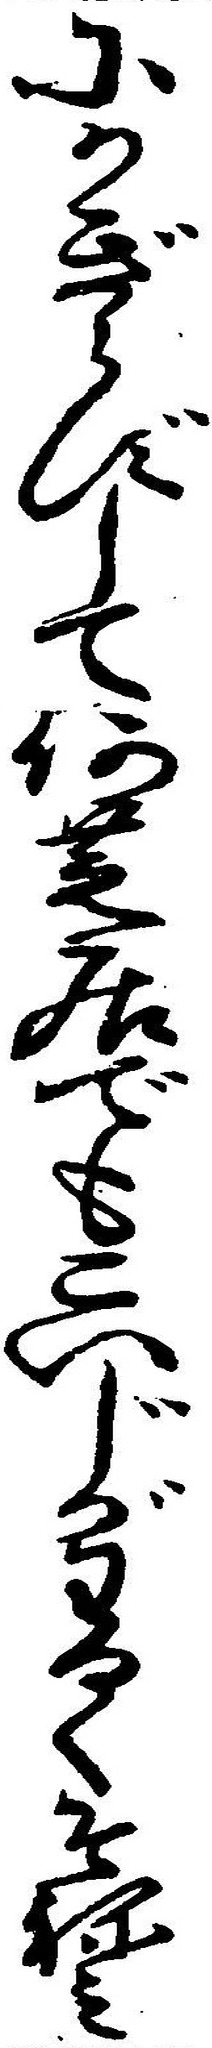にかぎらずして何芝居でもこいじがわるくそねみ
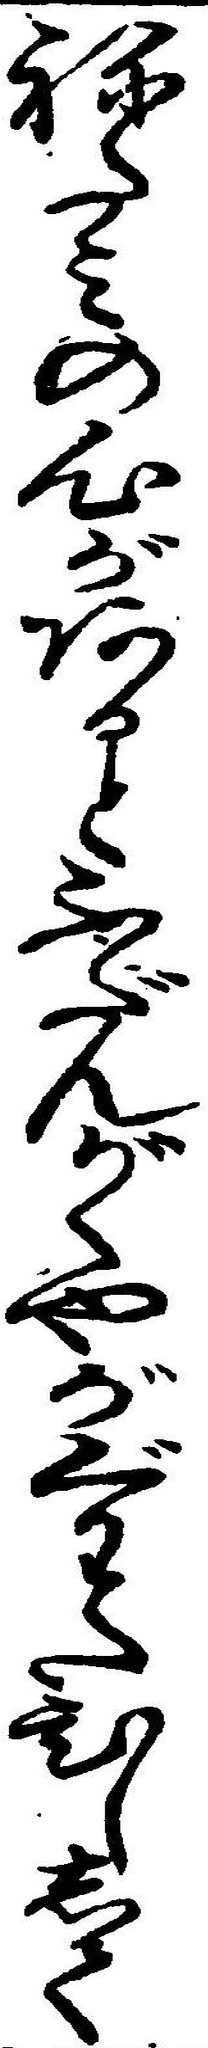ねたみの心があるとふだんがくやがぐわたひしして
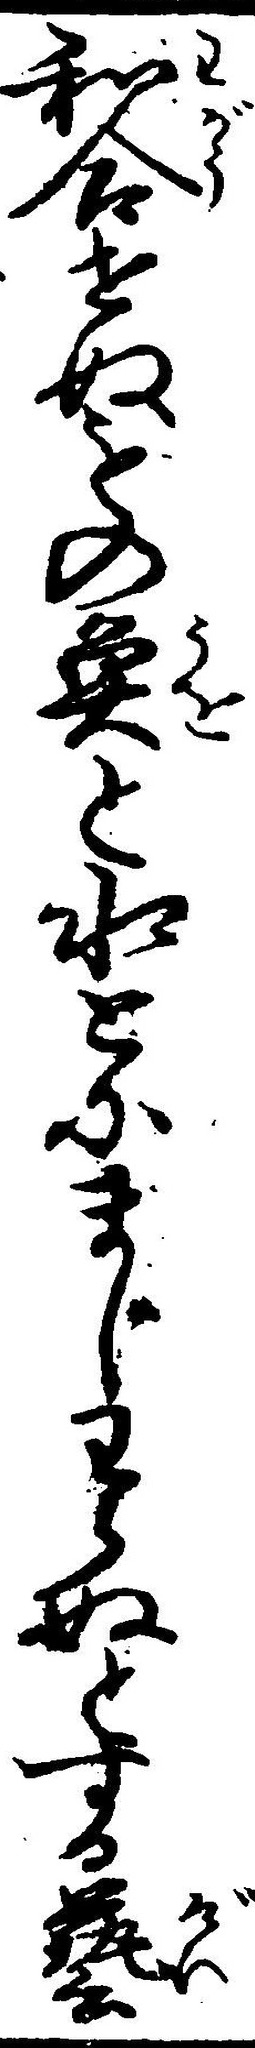和合せぬもの魚と水とにまじわらぬとする芸
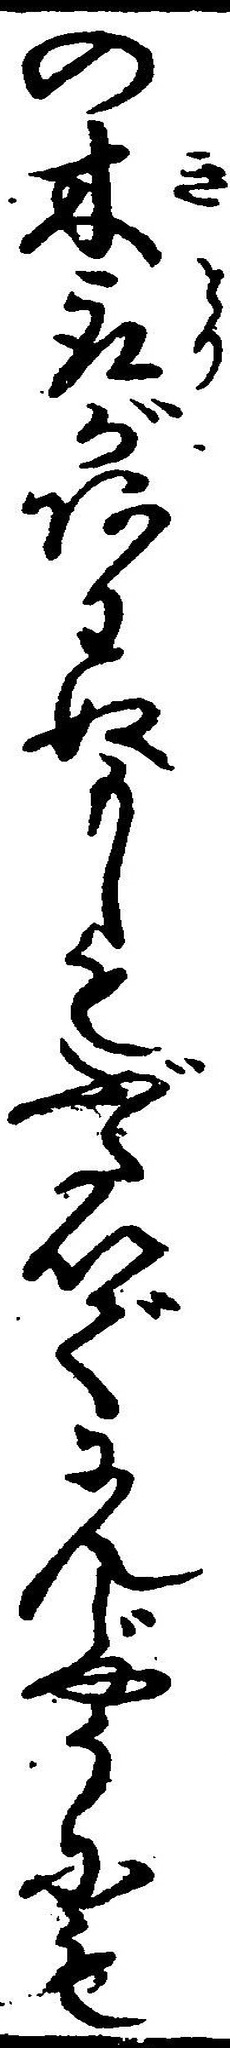の木取があわぬもしもぶたいでにんじやうにも
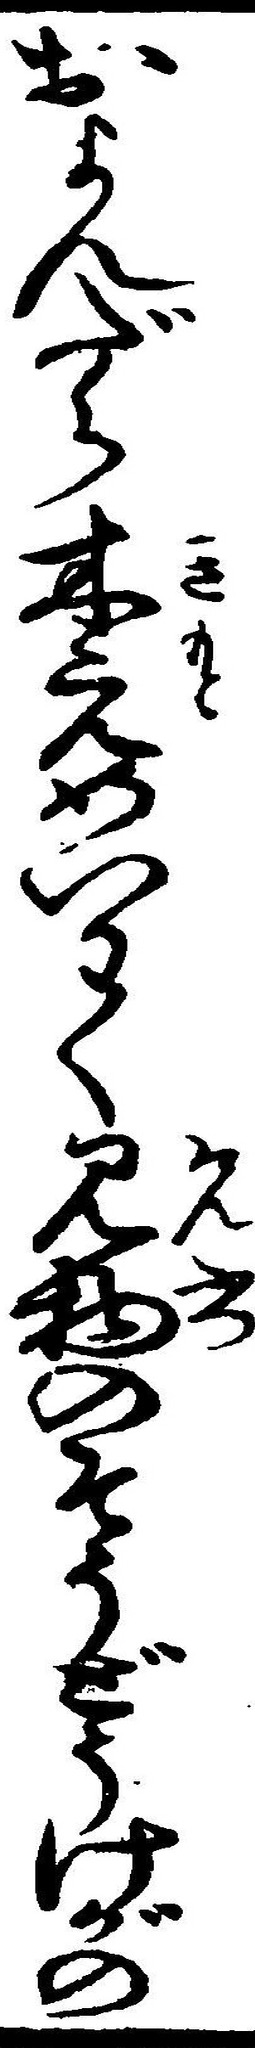およんだら木元めいわく見物のそうどうけがの

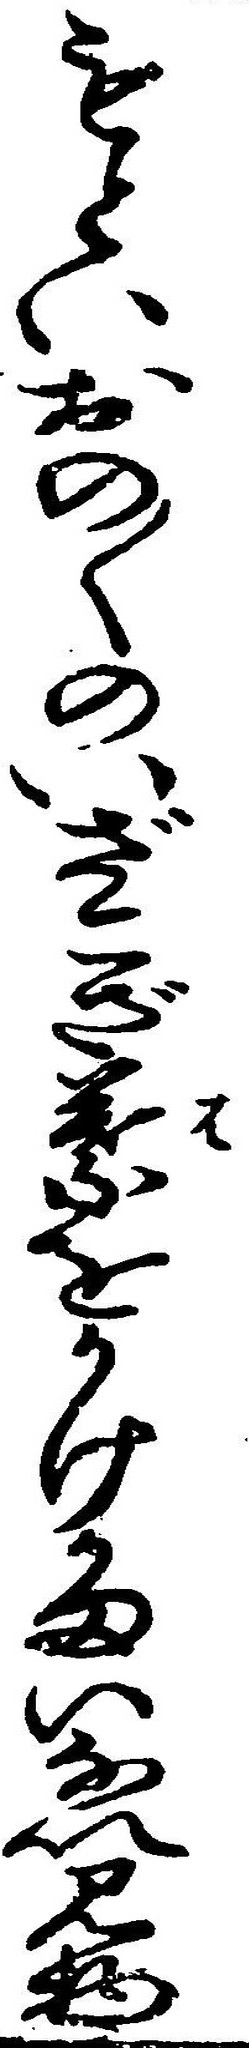もといおの〳〵いざこざ葉をかけかまいない見物
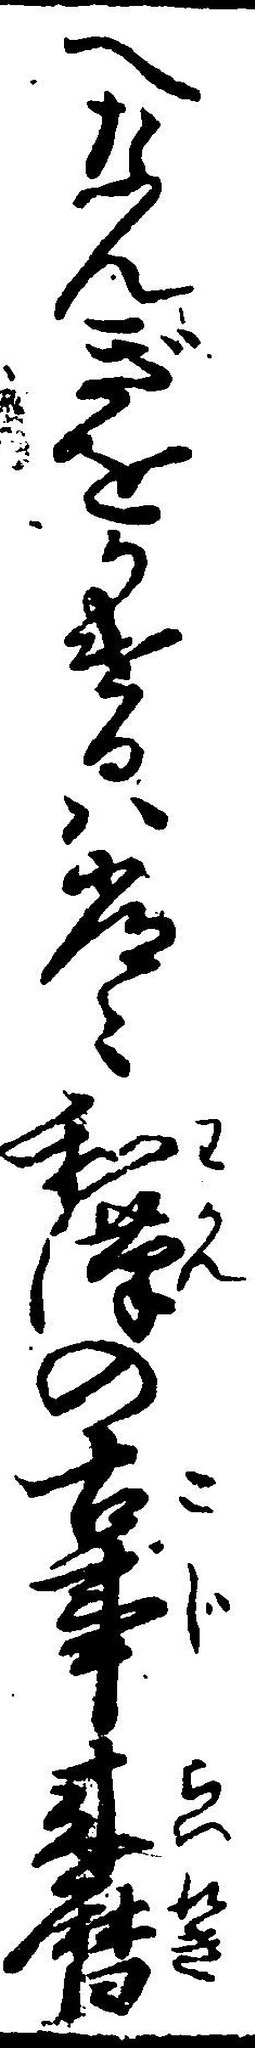へなんぎをかけるは堂々と和漢の故事来暦
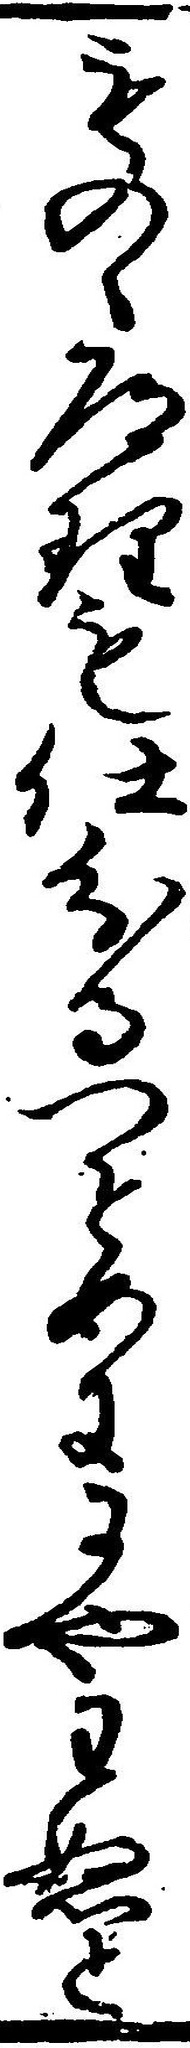ものゝ道理も仕分るつとめににやわぬと
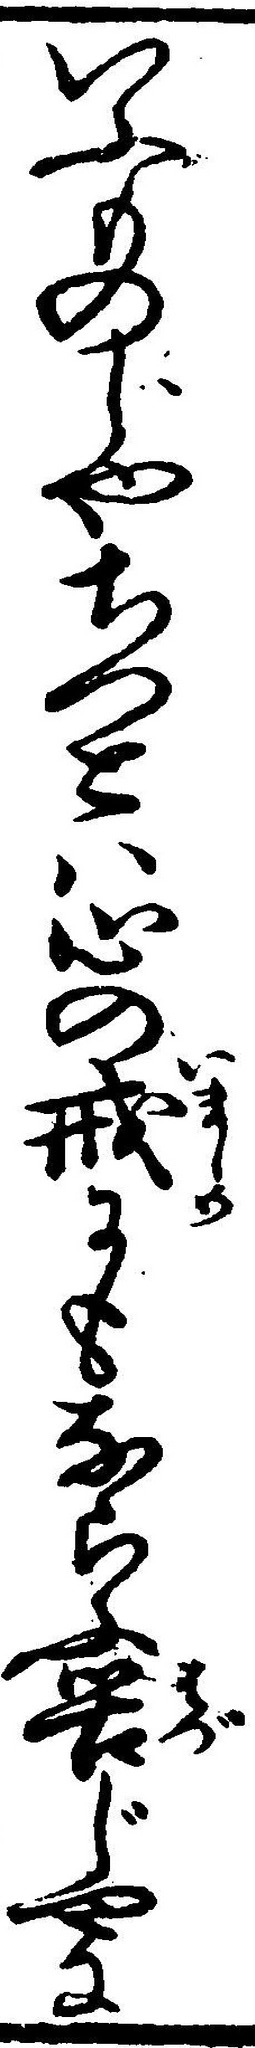いふものじやちつとは心のいましめにもならふ筈じやに
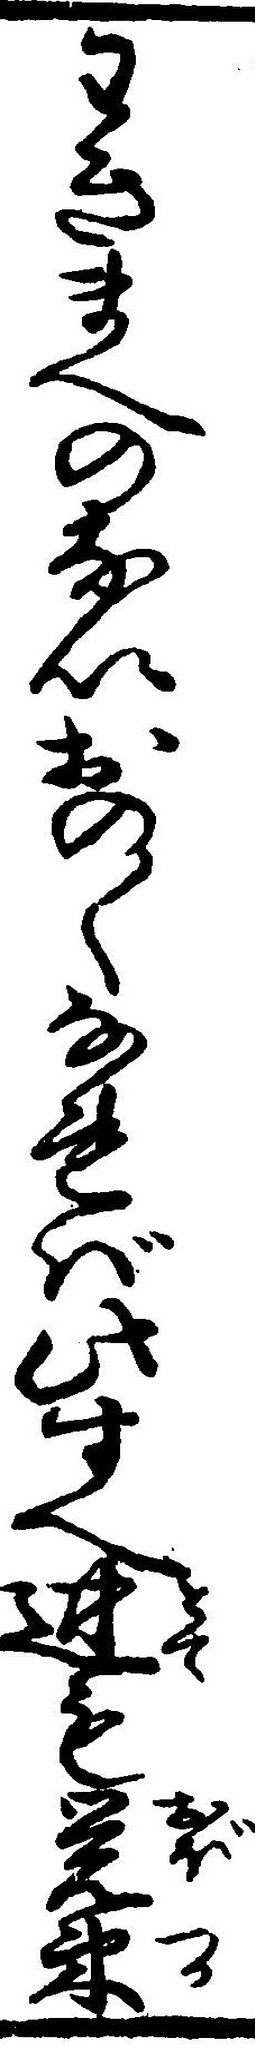わきまへのないおの〳〵なれば此すへ迚も覚束
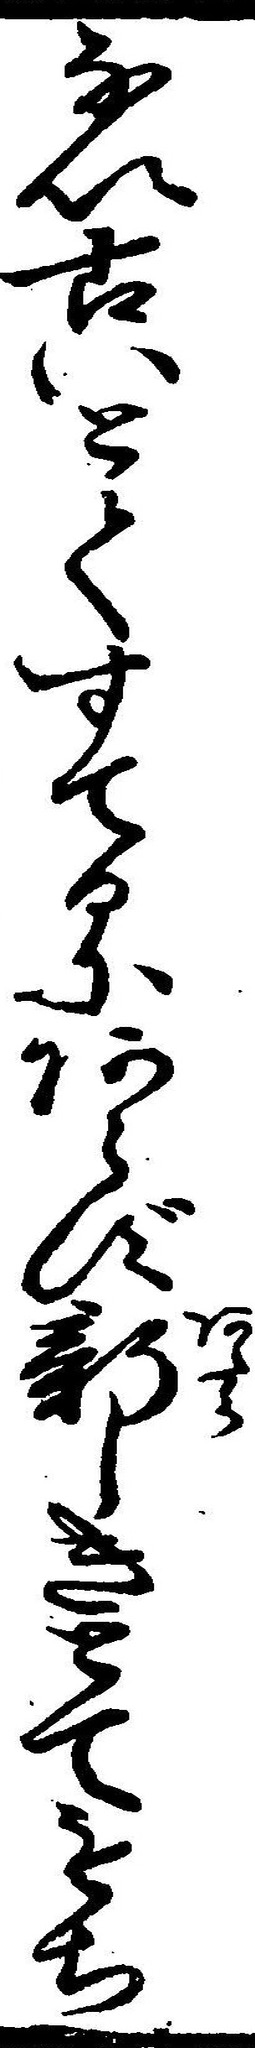ない古いとてすてるにあらず新しきとてもち
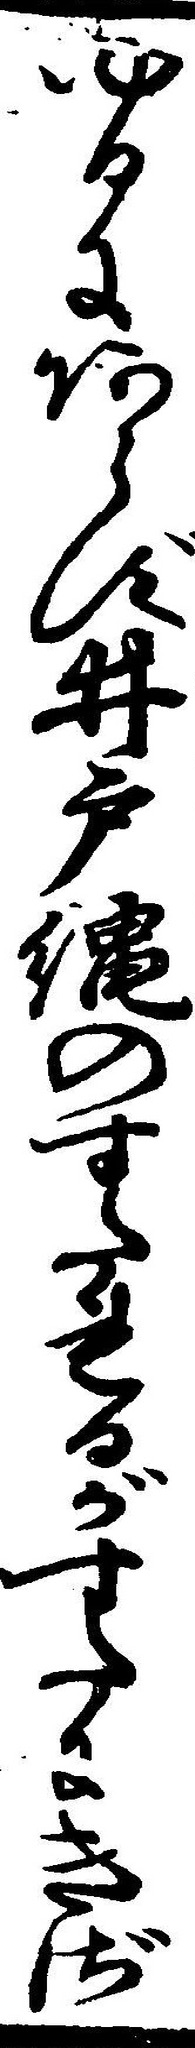ゆるにあらず井戸縄のすたれるがすたにきざ
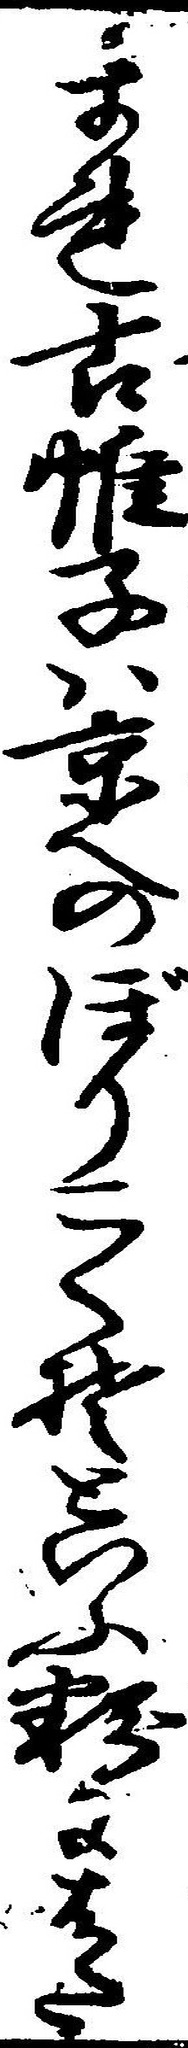まれ古帷子は京へのぼりこゝそといふ粉にはた
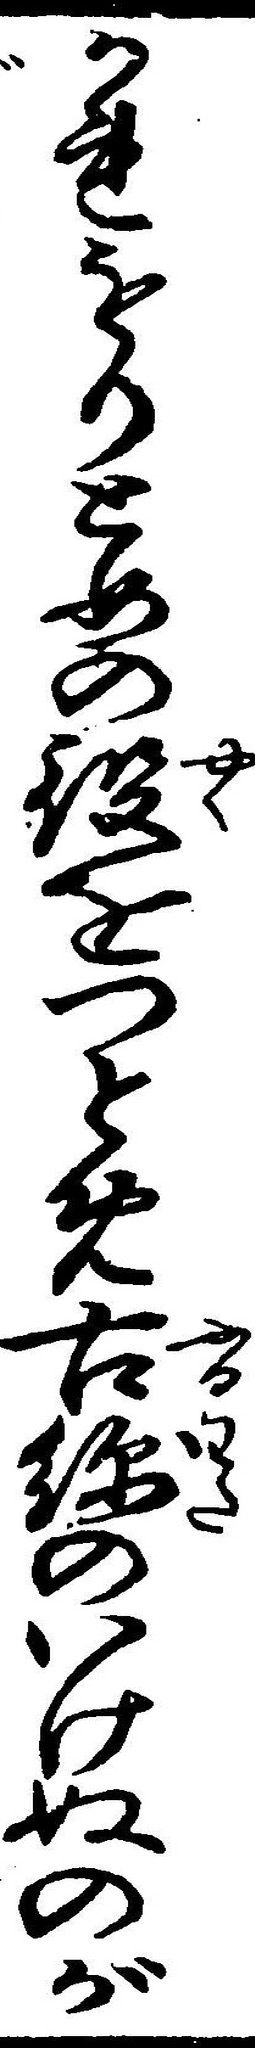かれもりとめの役をつとめ古綿のいけぬのが
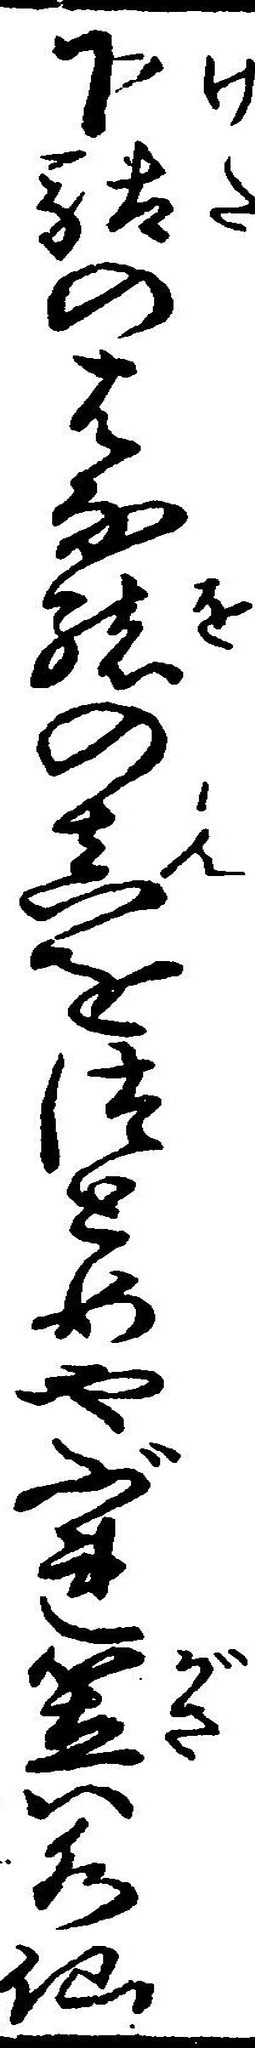下駄のはな緒の真をつとめやぶれ笠は水仙
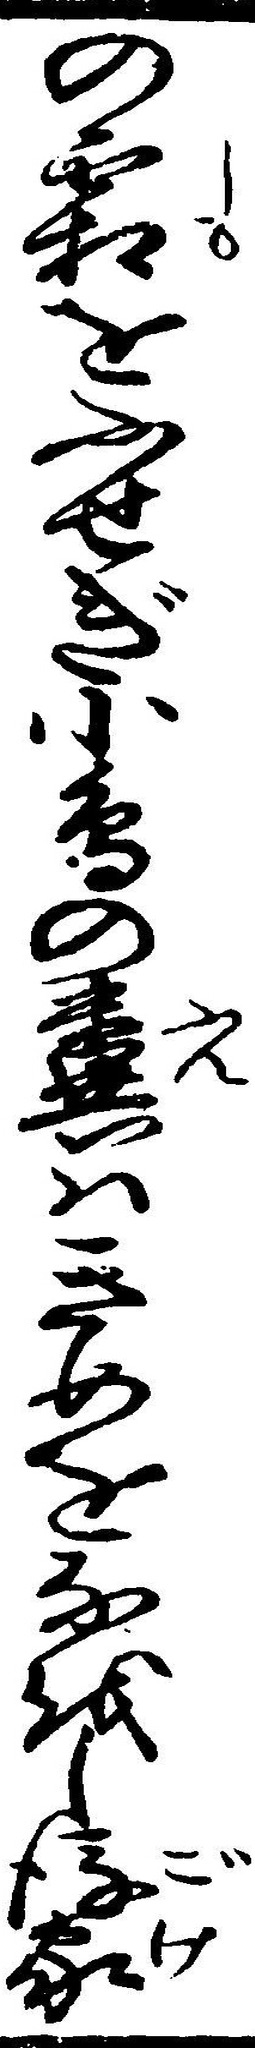の霜をふせぎ小鳥の糞はきめをなをし後家
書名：草木芝居化物退治 / 泉花堂三蝶(十六兵衛)作
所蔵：東京大学総合図書館 General Library in the University of Tokyo, JAPAN
